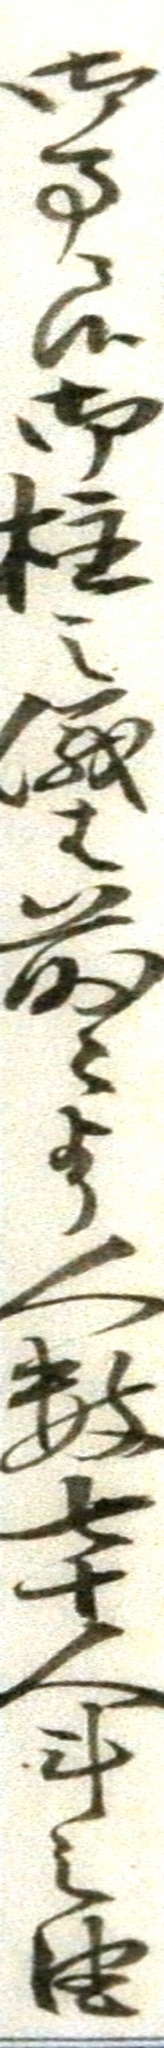御事ニ候御柱之儀者前々より人数七十人計之由
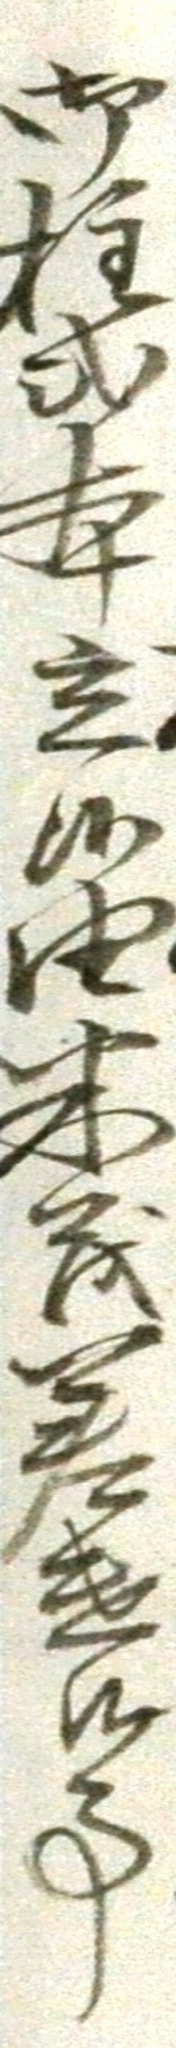御柱弐本立候由米も差遣候事
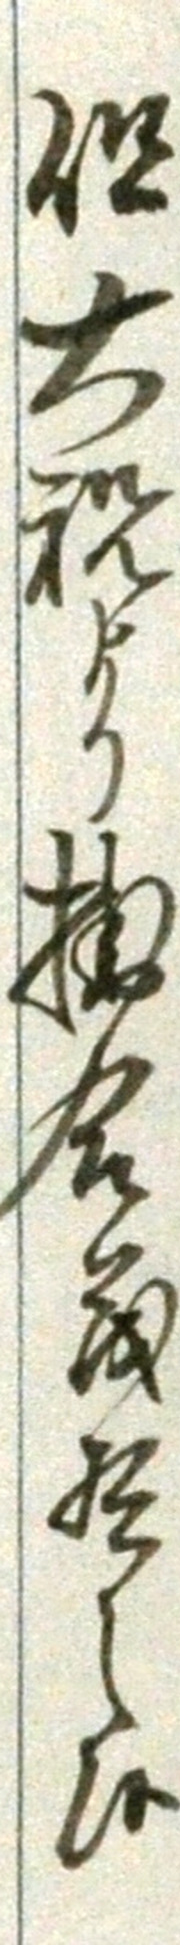但大祝より掛合も有之候
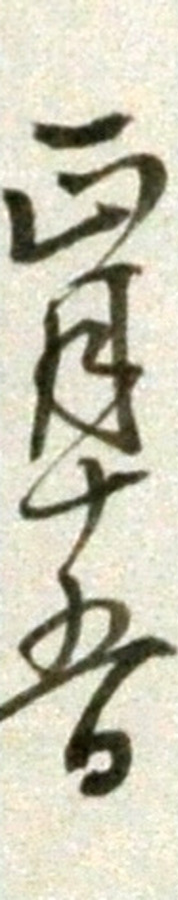正月十五日
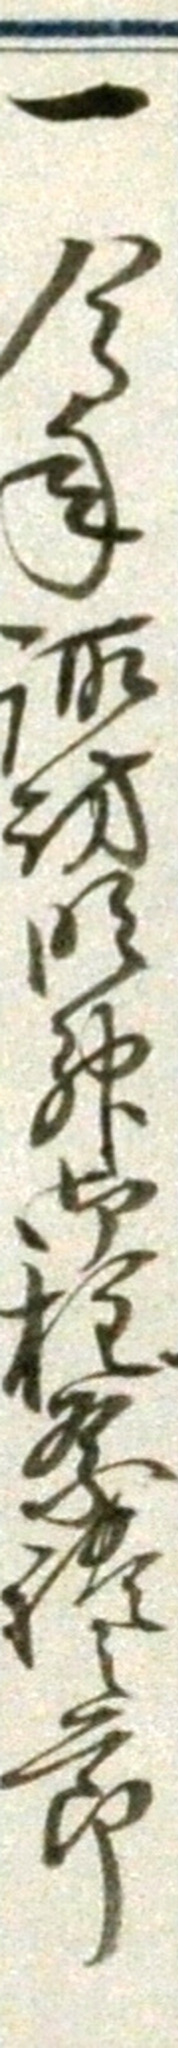一今年諏訪明神御柱祭礼之節物頭
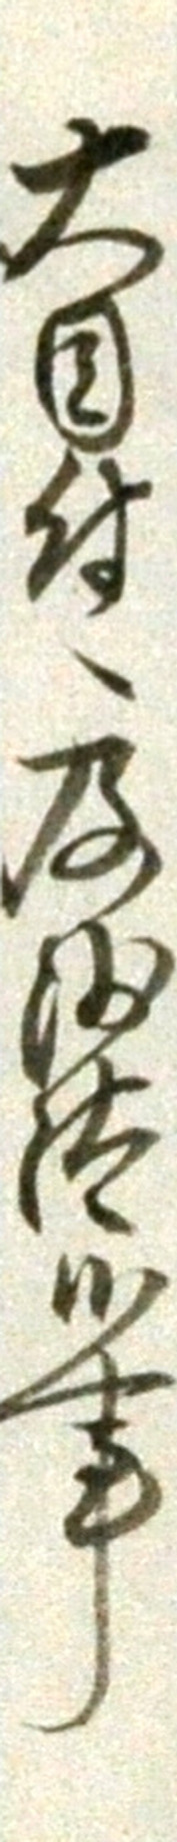大目付へ及沙汰候事
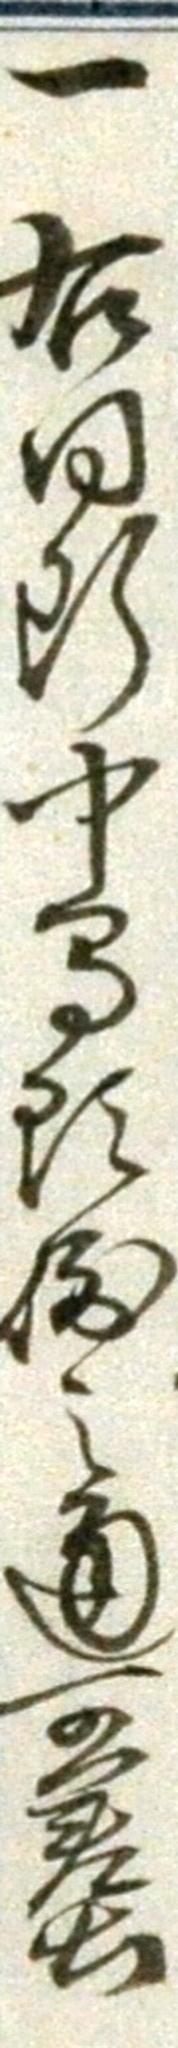一右同断中間頭例之通可差出
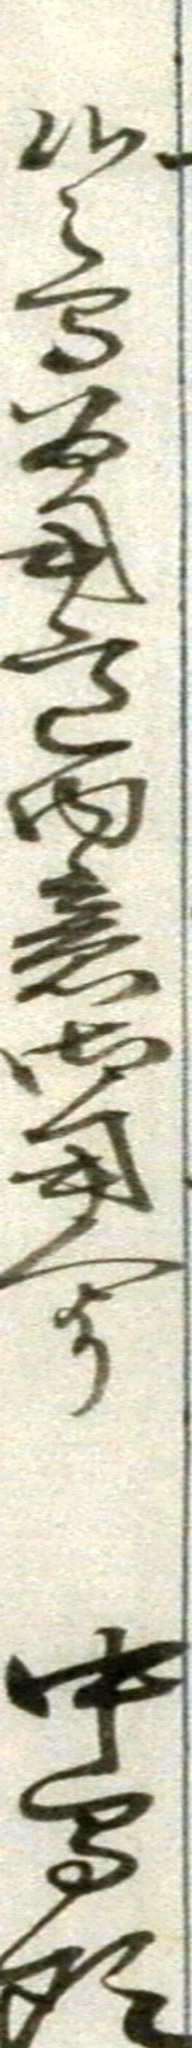候之間為用意内意御用人より中間頭
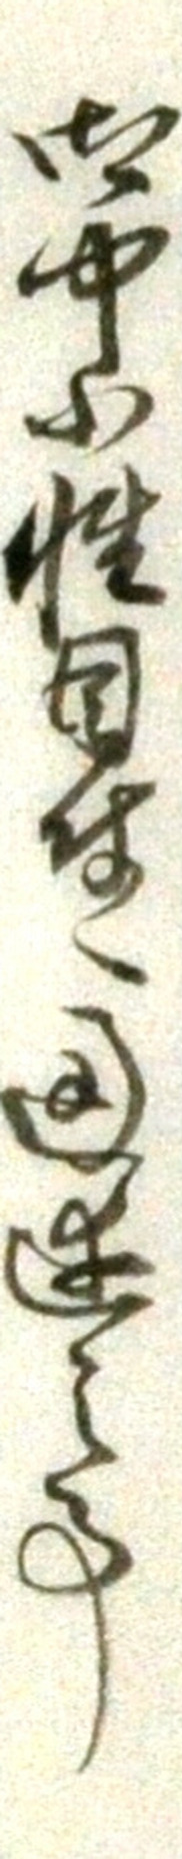御中小性目付へ通達之事
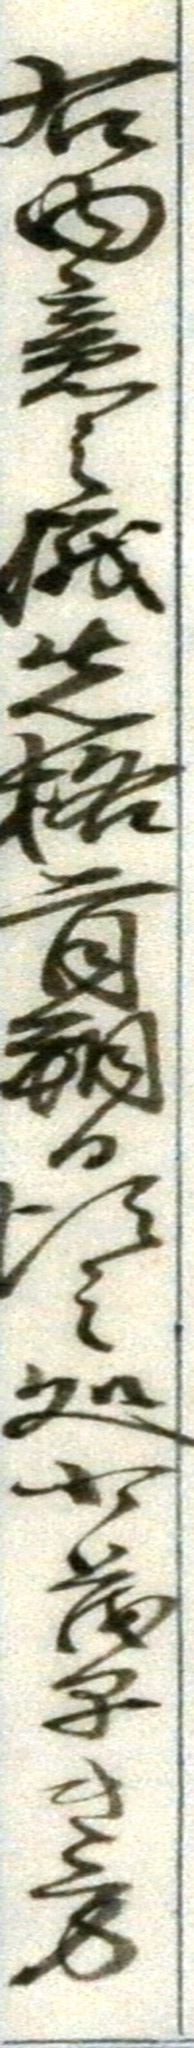右内意之儀先格二月朔日頃之処少も早き方
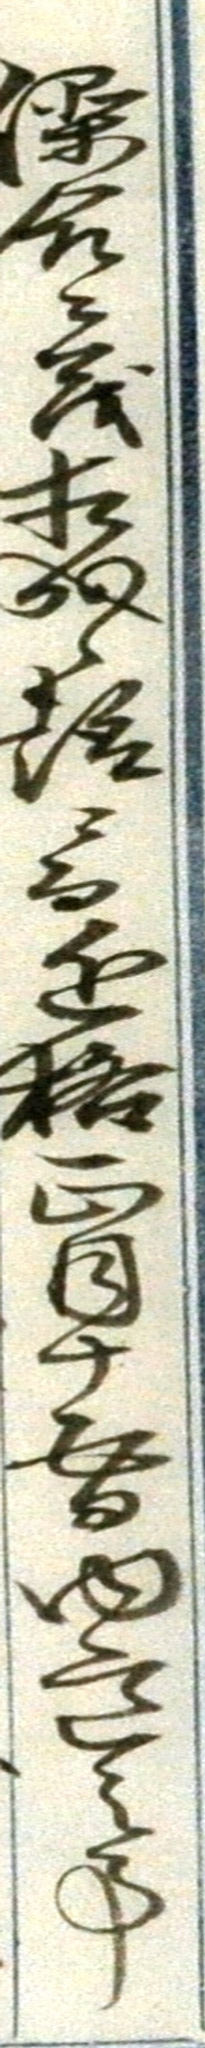繰合ニも相成候趣ニ而近格正月十五日内意之事
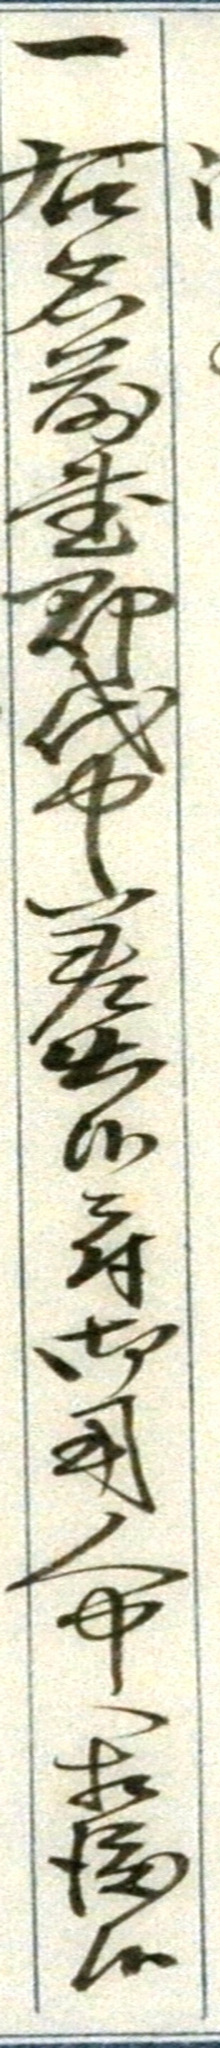一右名前書郡代中差出候ニ付御用人中へ相渡候
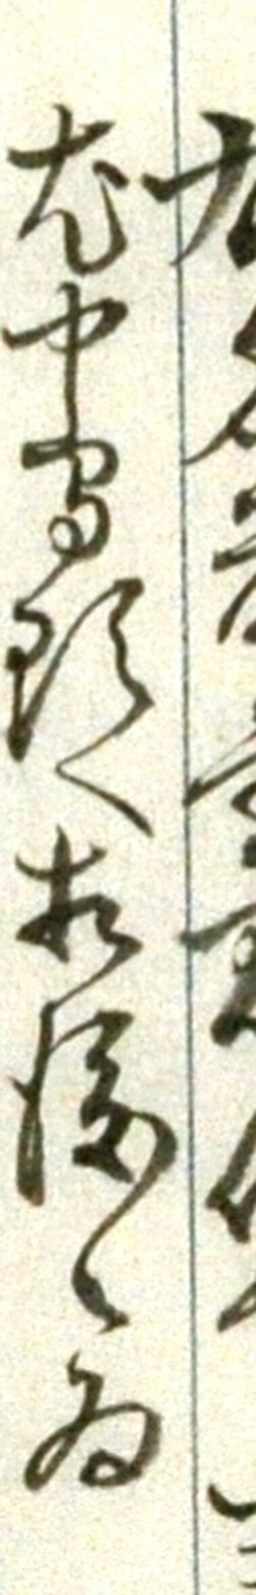尤中間頭へ相渡候為
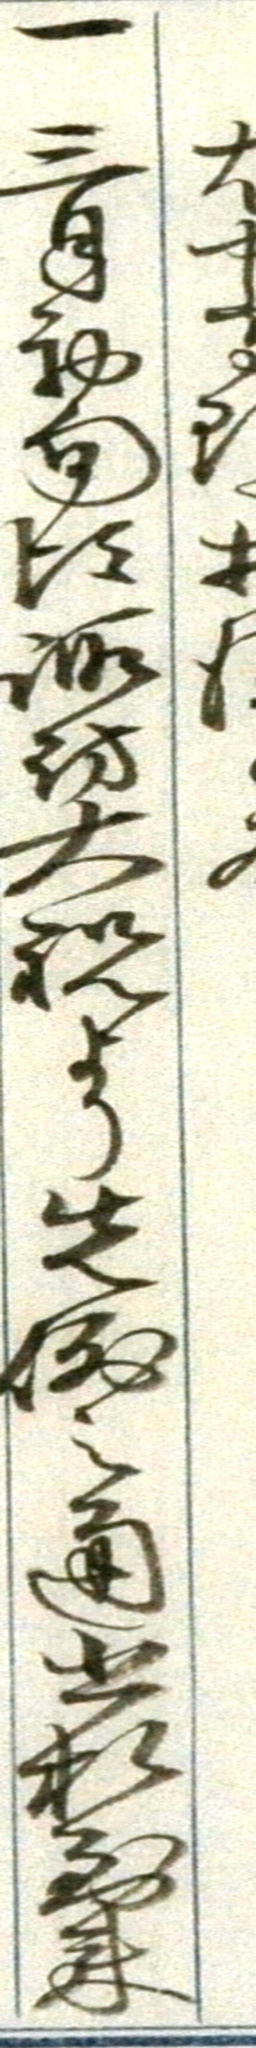一三月初旬頃諏訪大祝より先例之通書札到来
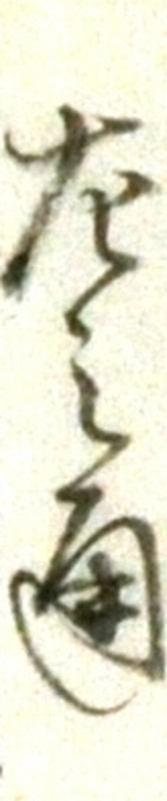左之通
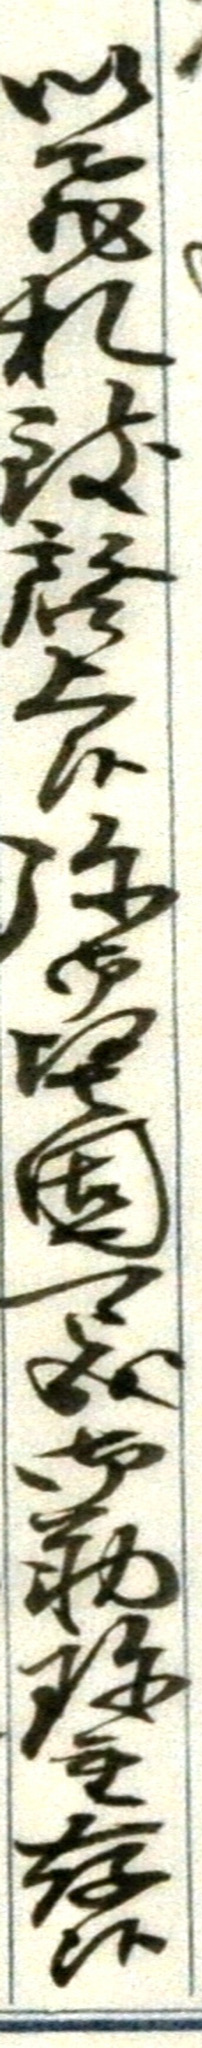以飛札致啓上候弥御堅固可成御勤珎重存候
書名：諏訪御柱祭之節・騎馬大将御中間頭・御柱引人足
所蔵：伊那市立高遠町図書館・合同会社AMANE
